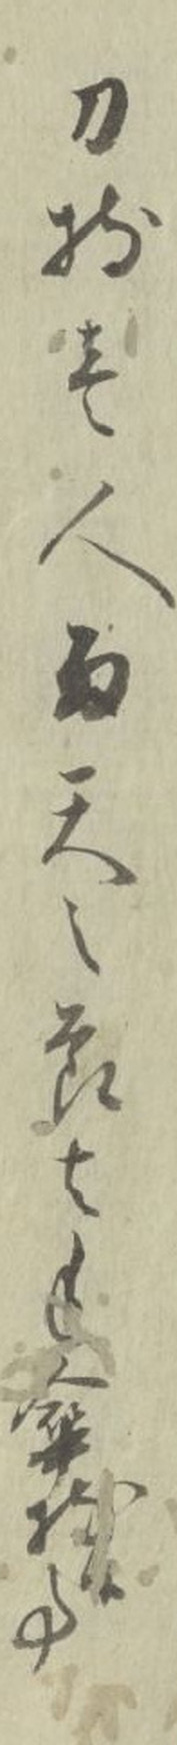刀持壱人雨天之節は手傘用持候事
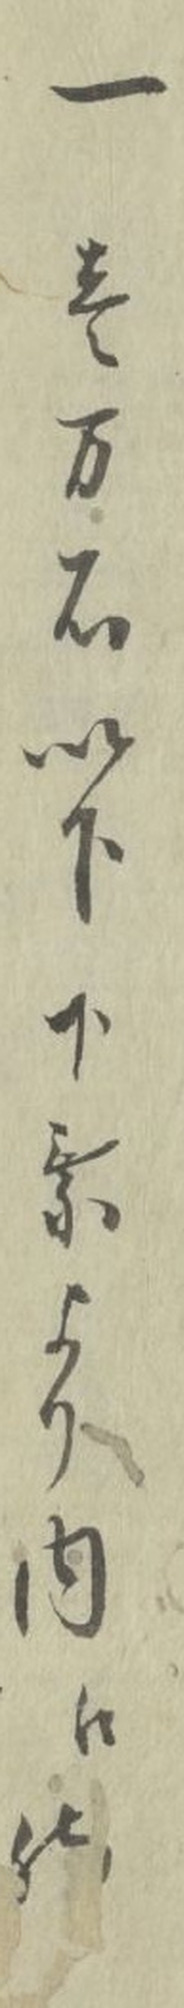一壱万石以下下乗より内え侍
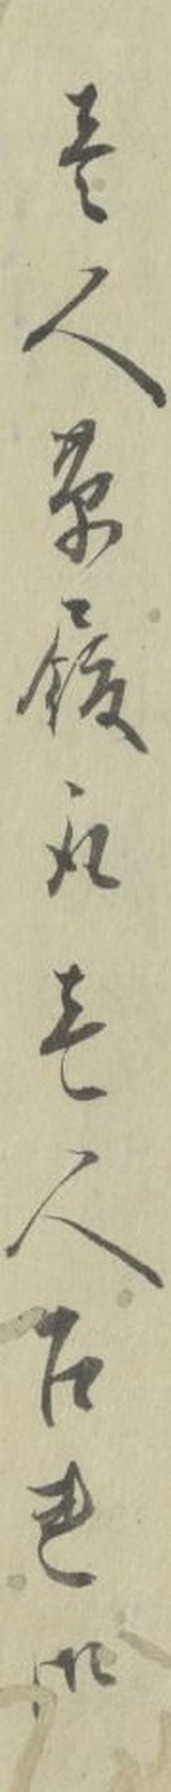壱人草履取壱人召連御
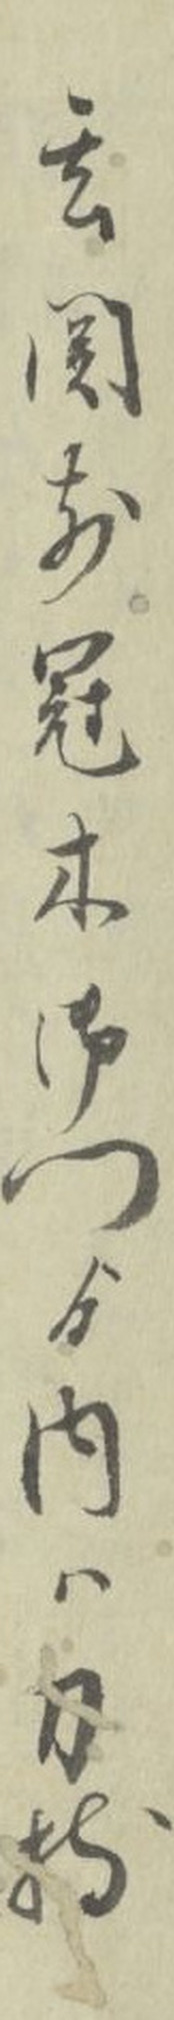玄関前冠木御門ゟ内は刀持
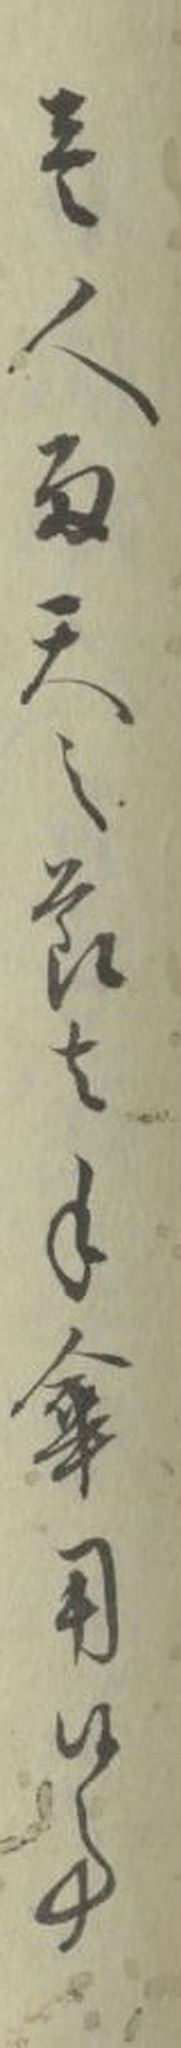壱人雨天之節は手傘用候事
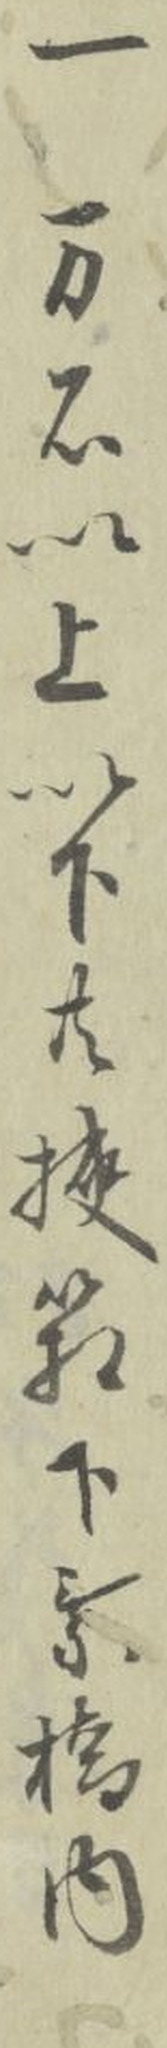一万石以上以下共挟箱下乗橋内
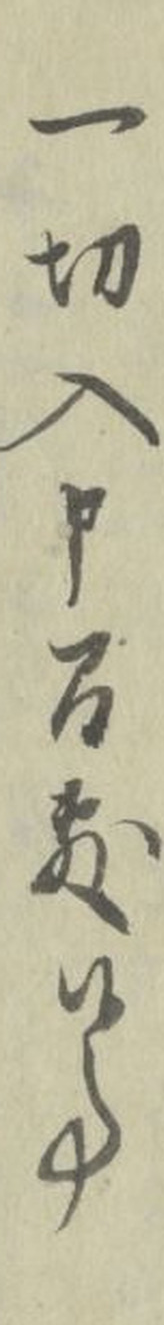一切入申間敷候事
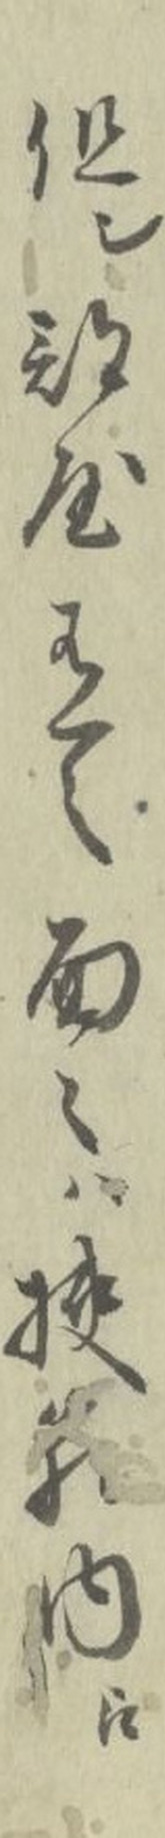但し部屋有之面々は挟箱内え
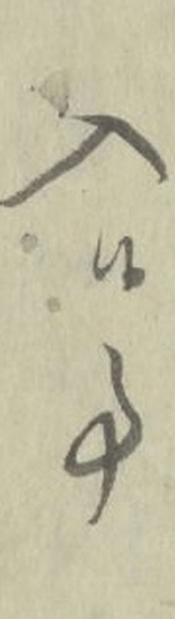入候事
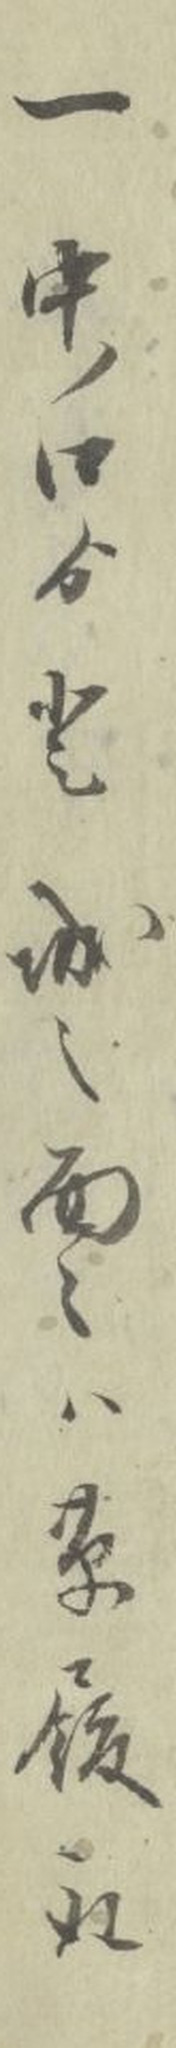一中の口ゟ登城之面々は草履取

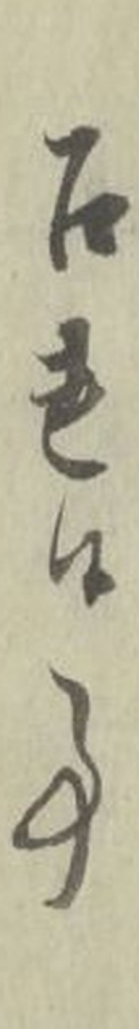召連候事
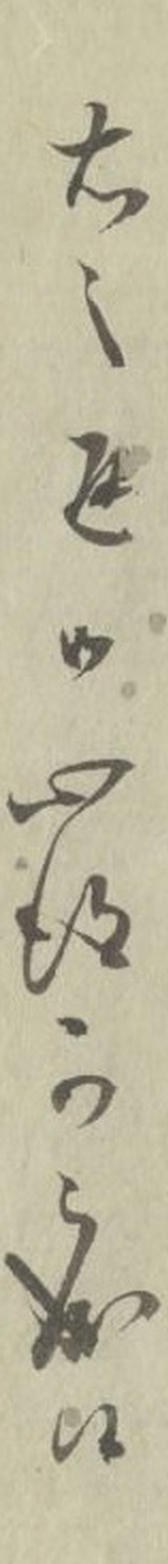右之通御心得可被成候
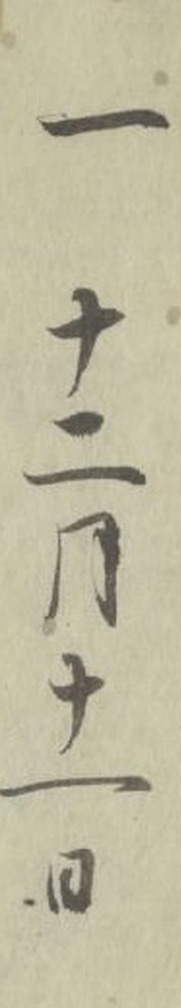一十二月十一日
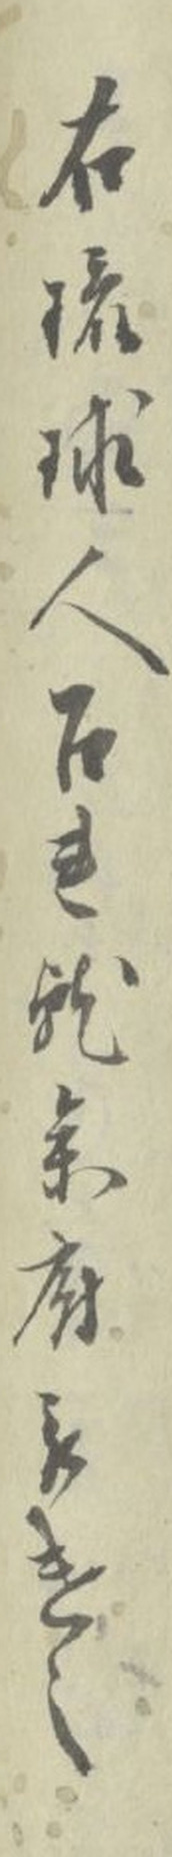右琉球人召連就参府被遣之
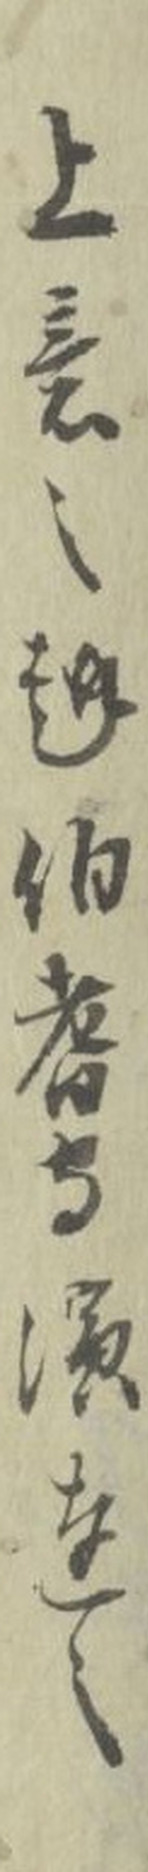上意之趣伯耆守演達之
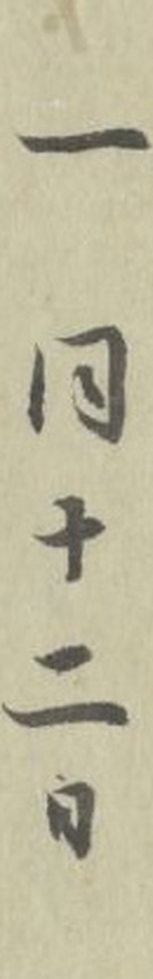一同十二日
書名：琉球来朝記 自一至七
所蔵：University of the Ryukyus Library
